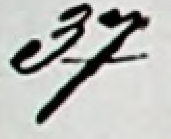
37
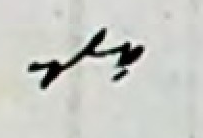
do
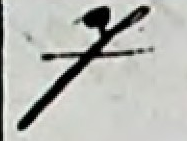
7
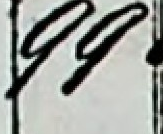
99
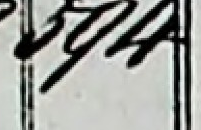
594
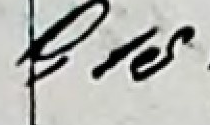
0,15
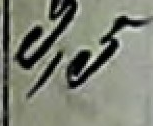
3,5
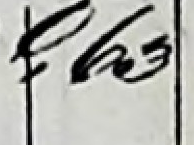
0,63
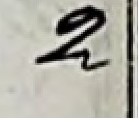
2
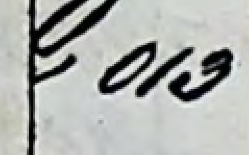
0,013
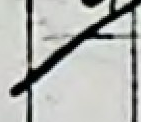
7
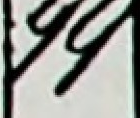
99
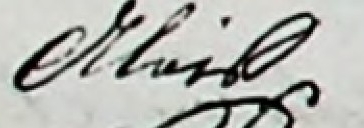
Alois
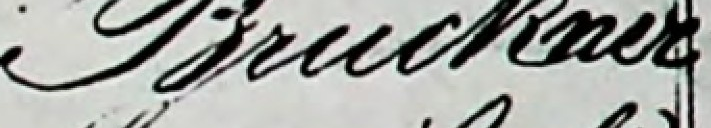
Bruckner
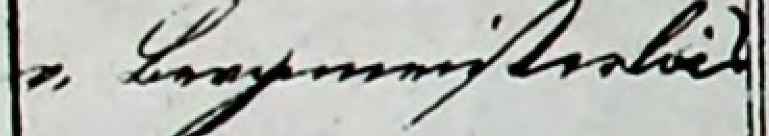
v. Bergmeisterlois
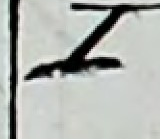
I
